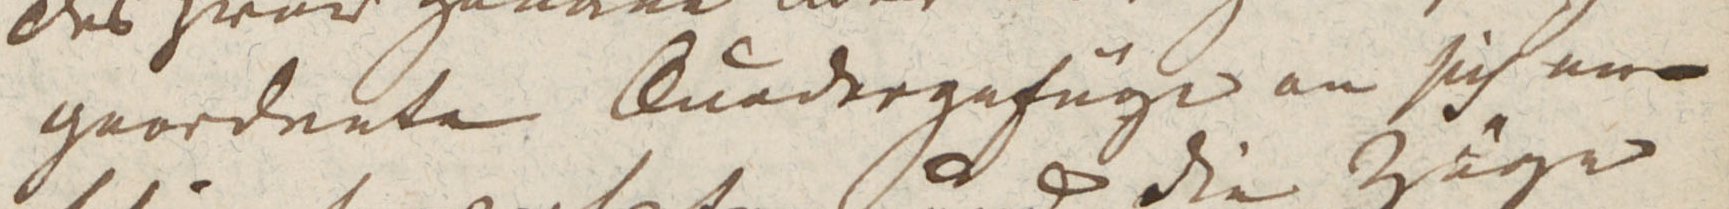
geordnete Quadergefüge an sich un-
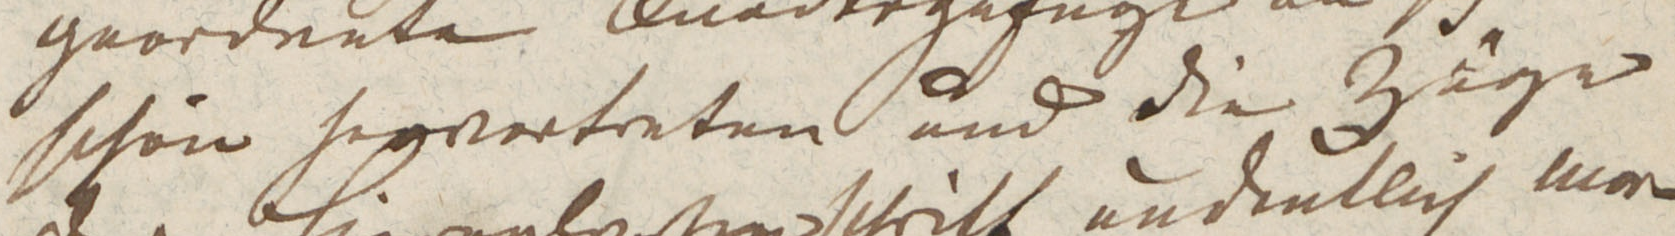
schön hervortreten und die Züge
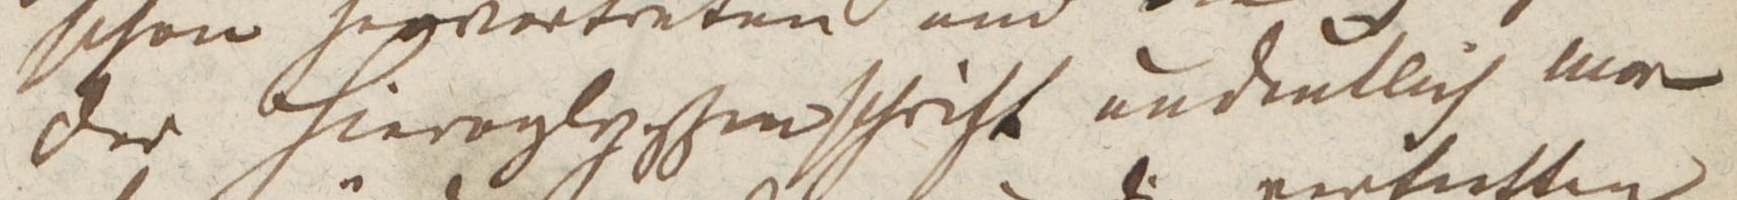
der Hieroglyphenschrift undeutlich ma-
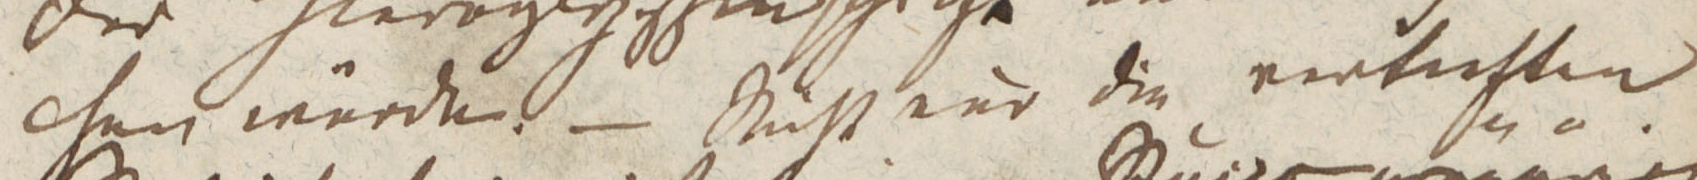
chen würde. – Nicht nur die vertieften
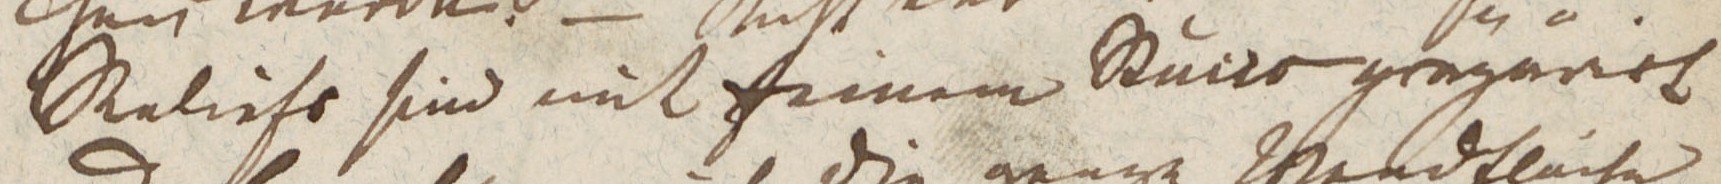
Reliefs sind mit feinem Stucco präparirt
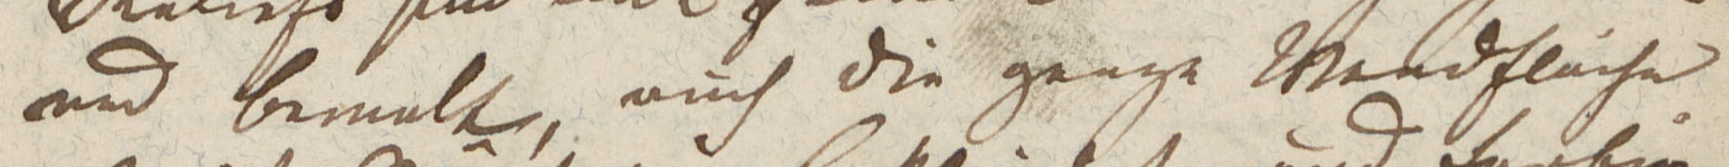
und bemalt, auch die ganze Wandfläche
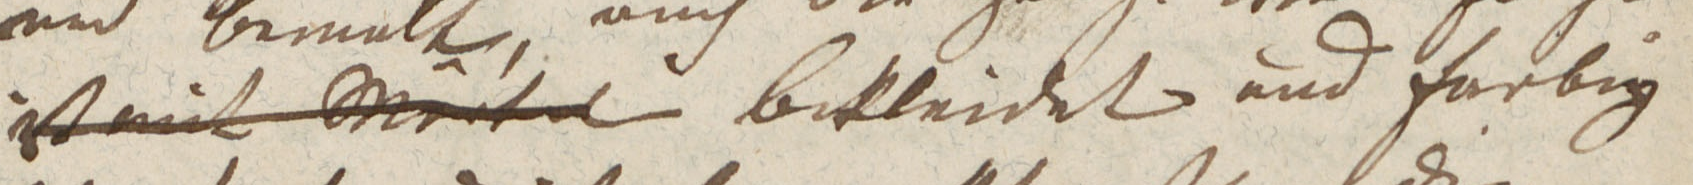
ist mit Mörtel bekleidet und farbig
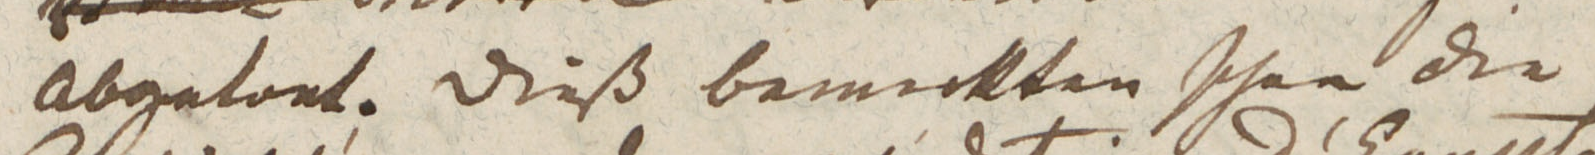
abgetont;. Diess bemerkten schon die
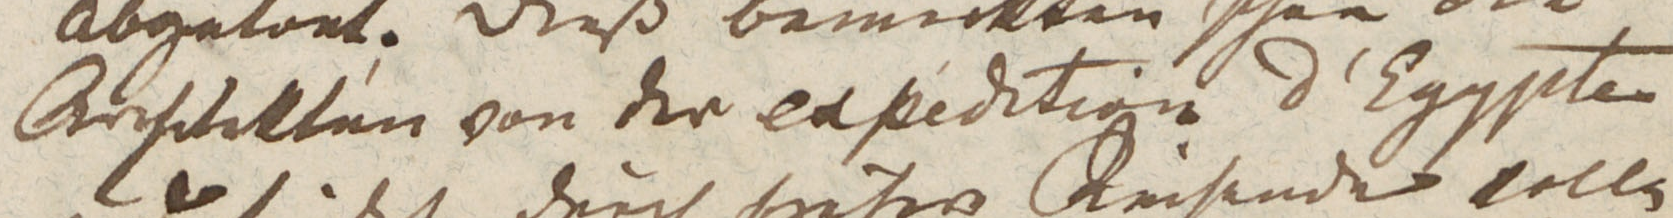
Architekten von der expédition d'Egypte
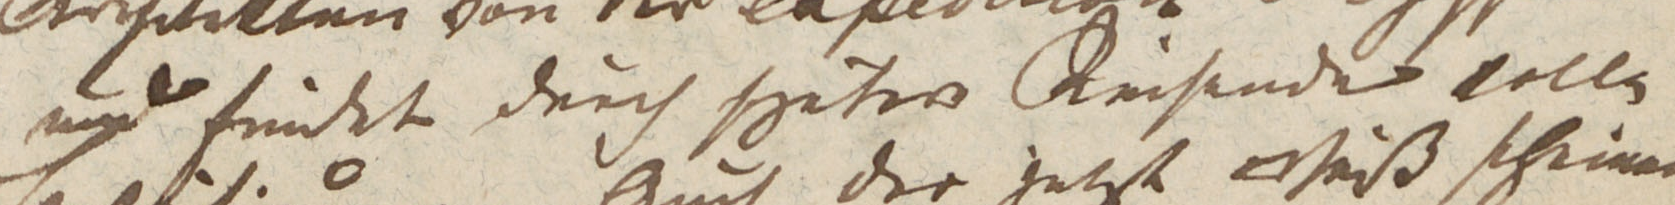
und findet durch später Reisende volle
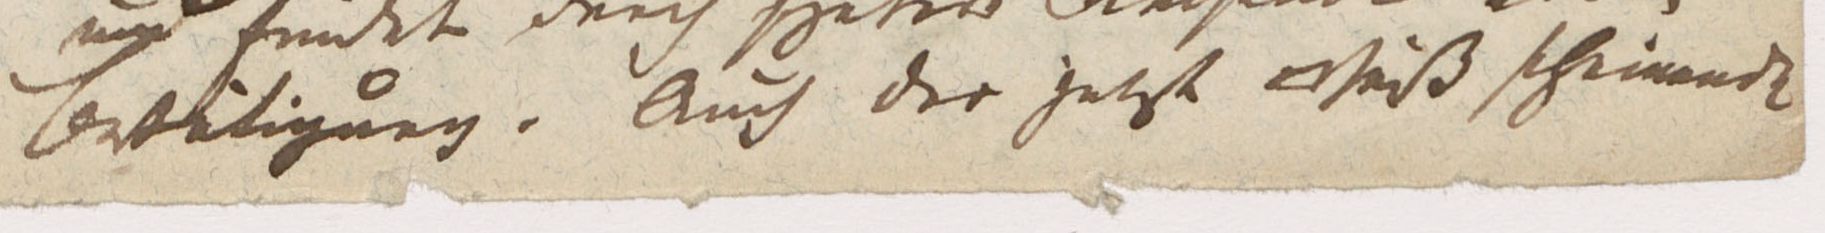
Bestätigung. Auch der jetzt weiss scheinende
